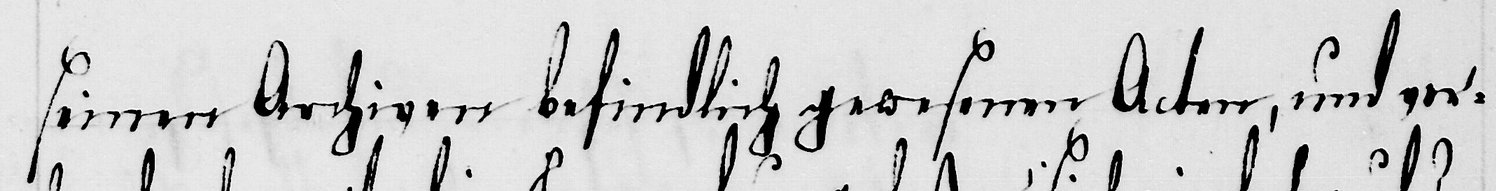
seinen Archiven befindlich gewesenen Acten, und ver¬
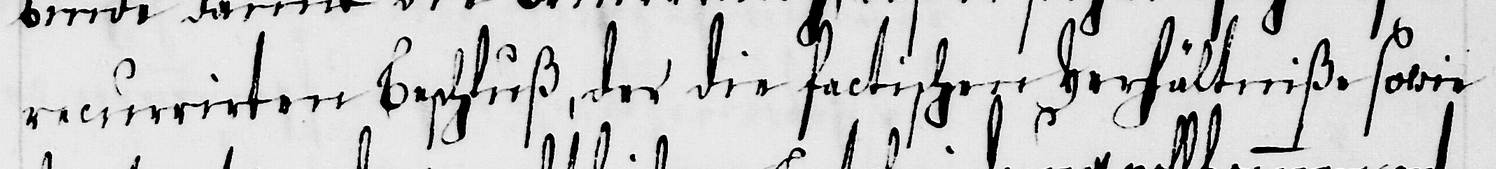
recurrirten Beschluß, der die factischen Verhältniße sowie
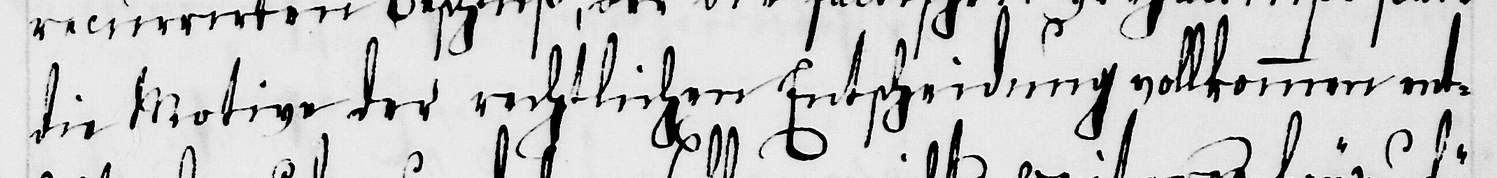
die Motive der rechtlichen Entscheidung vollkommen ent¬
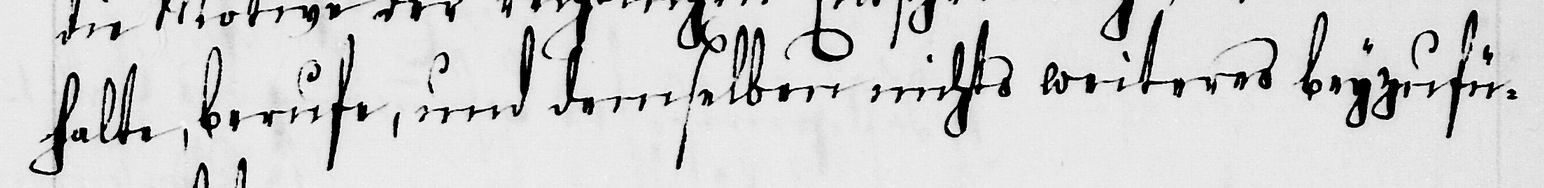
halte, berufe, und demselben nichts weiteres beyzufü¬
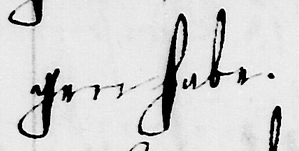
gen habe.
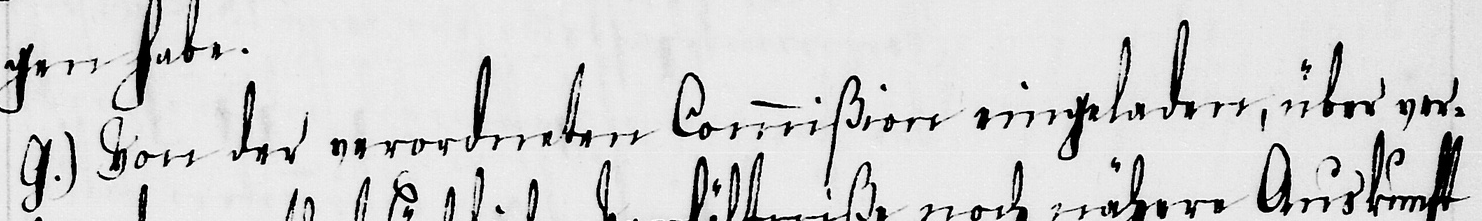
G.) Von der verordneten Commißion eingeladen, über ver¬
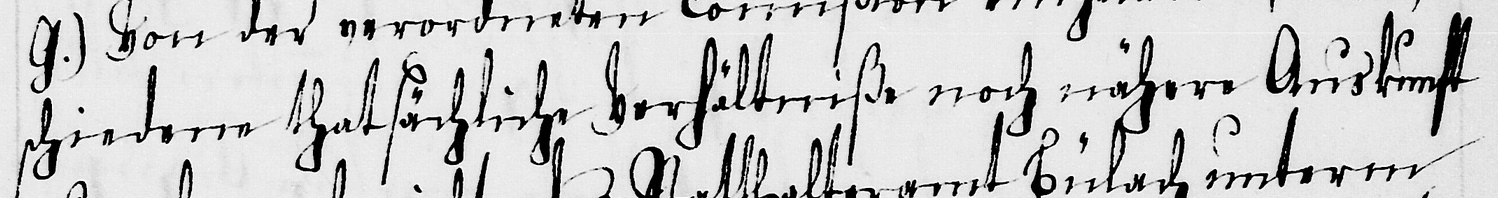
schiedene thatsächliche Verhältniße noch nähere Auskunft
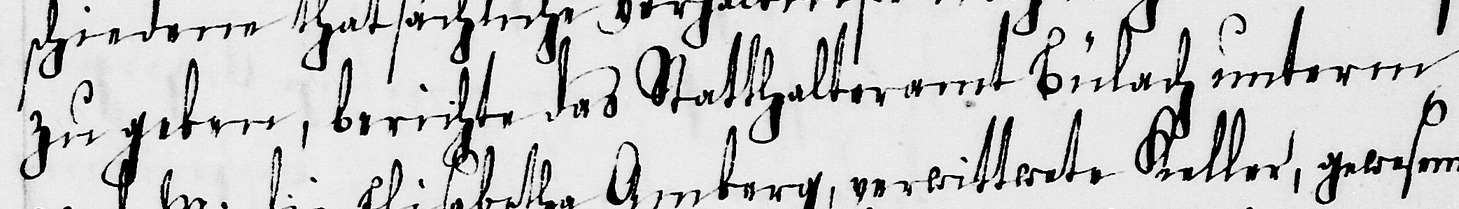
zu geben, berichte das Statthalteramt Bülach unterm
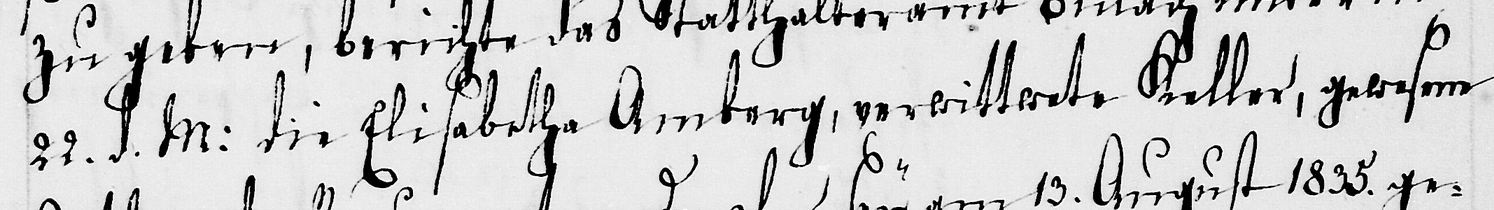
22. d. M: die Elisabetha Amberg, verwittwete Keller, gewesene
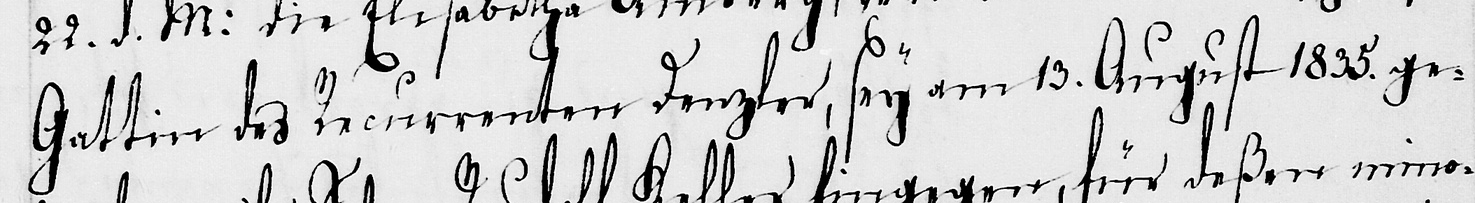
Gattin des Recurrenten Denzler, sey am 13. August 1835. ge¬
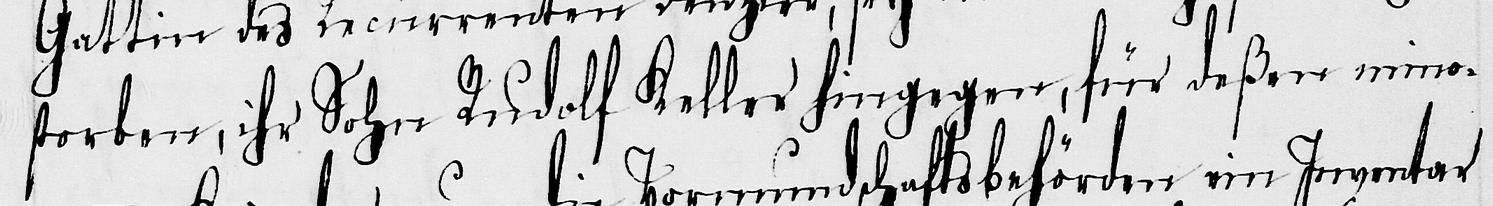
storben, ihr Sohn Rudolf Keller hingegen, für deßen mino¬
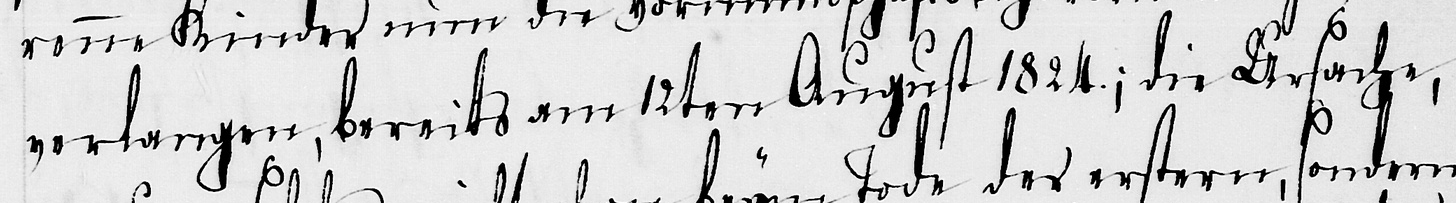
verlangen, bereits am 12ten August 1824.; die Ursache,
